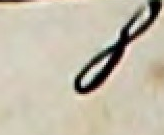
8
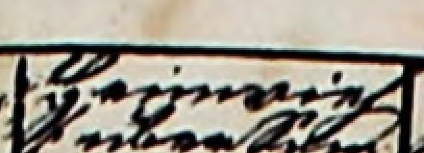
Heimvieh
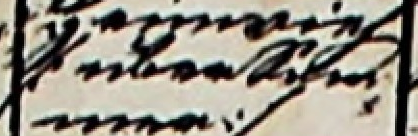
über S???
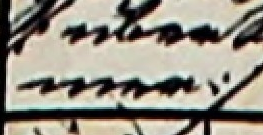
mer.
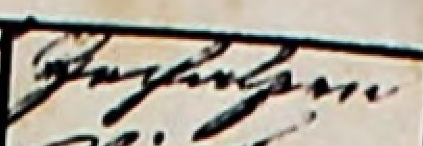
Zechalgen
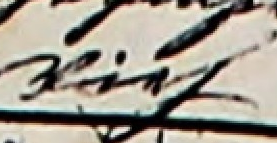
Vieh
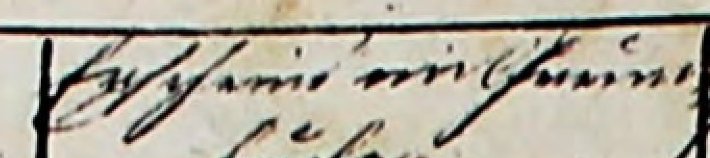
Erscheint im Grund„
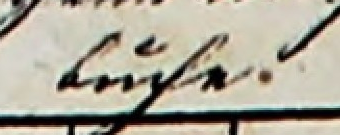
buche
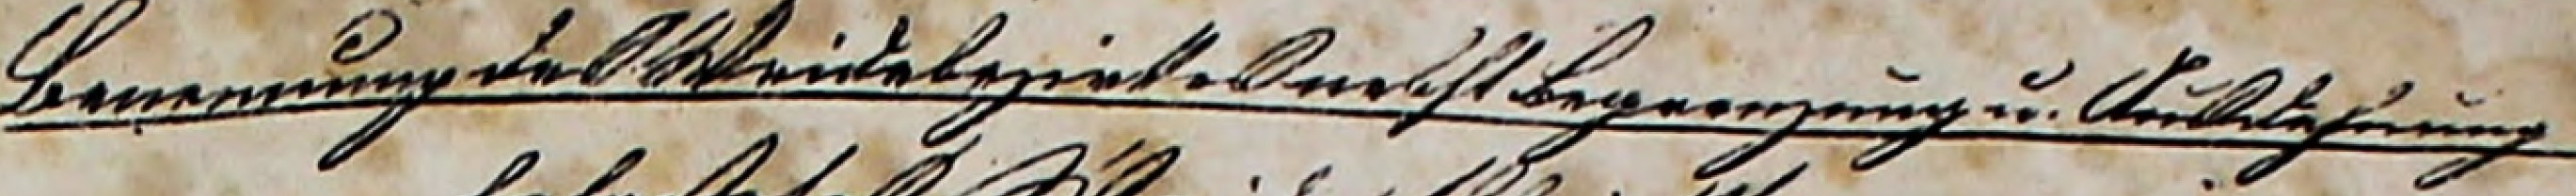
Benennung des Weidabezirkes nebst Begrenzung u. Ausdehnung
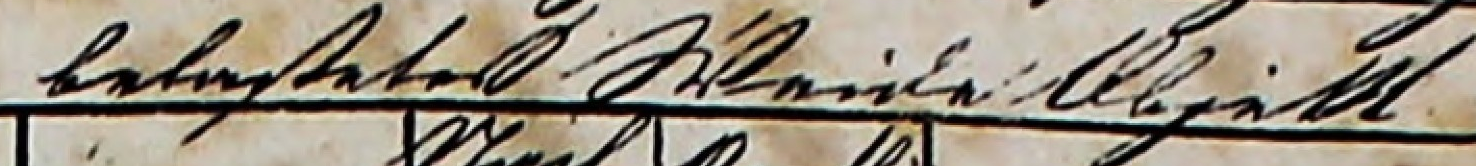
belaßetes Weide Objekt
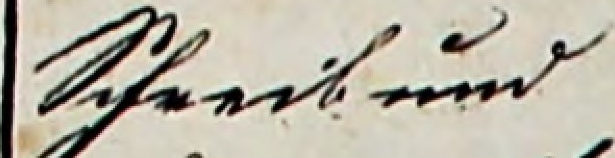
Schreib und
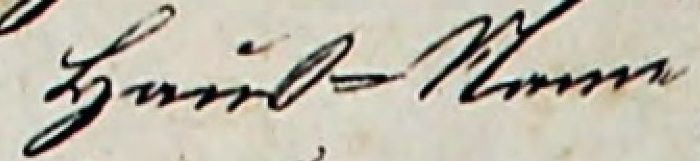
Haus=Name
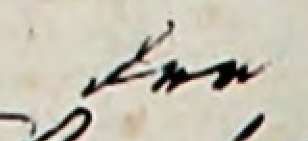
der
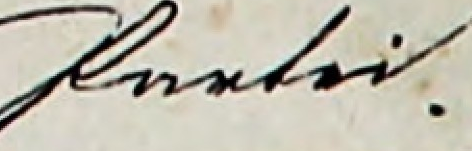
Partei
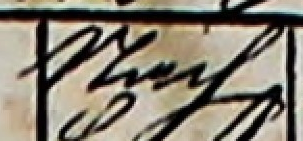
Nach
